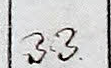33.
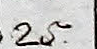25.
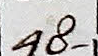48
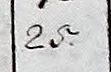25.
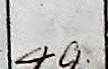49.
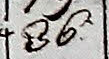36.
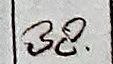38.
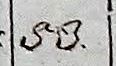53.
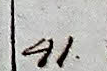41.
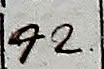42
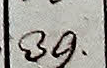39.
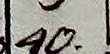40.
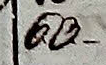60
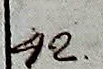42.
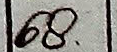68.
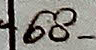68
